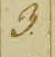3.
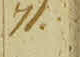71.
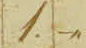1.
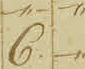6.
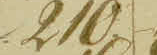210.
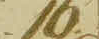16.
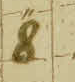8
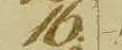16.
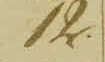12.
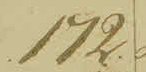172.
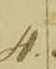4.
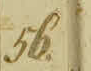56.
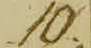10.
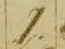1.
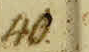40.
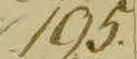195.
